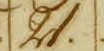21.
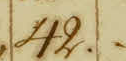42.
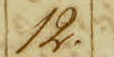12.
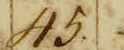45.
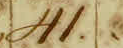41.
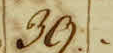39.
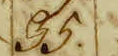35.
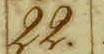22.
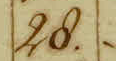28.
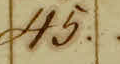45.
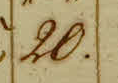20.
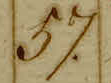57.
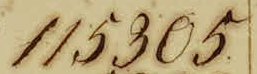115305.
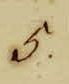5.
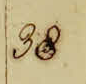38
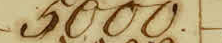5000.
